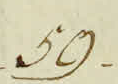59
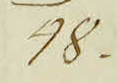48
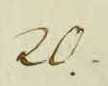20
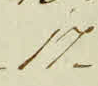17
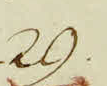29
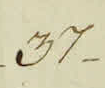37
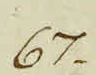67
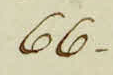66
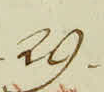29
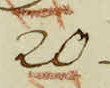20
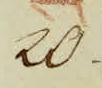20
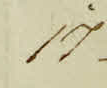17
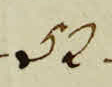52
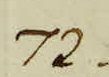72
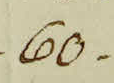60
